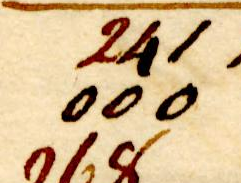000
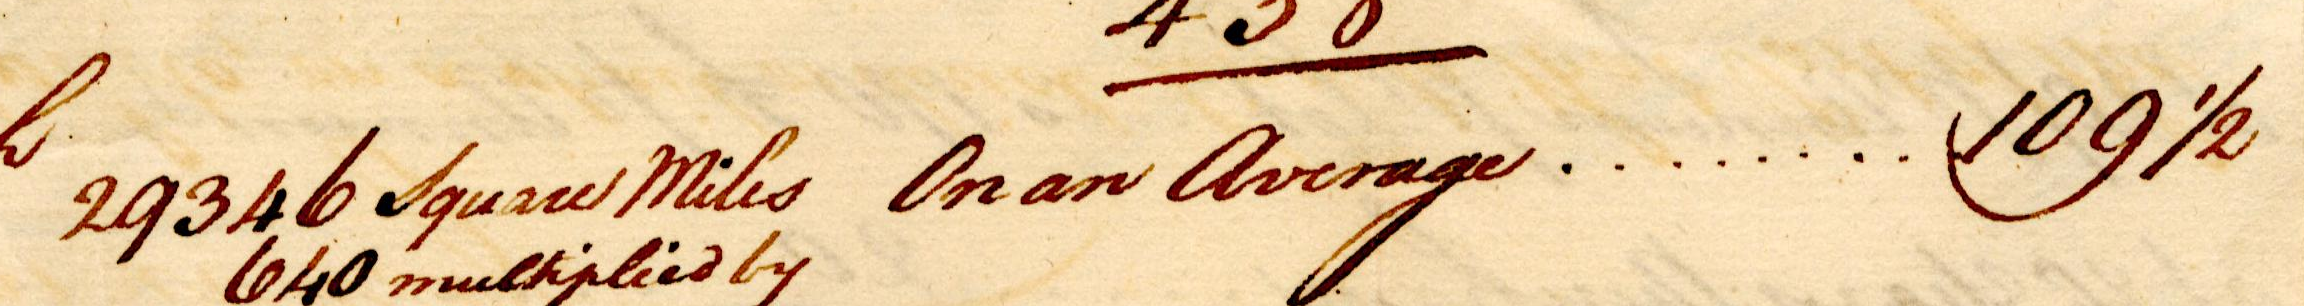29346 Square Miles on an Average...... 109 1/2
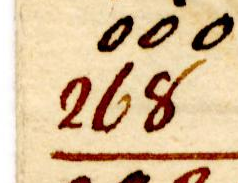268
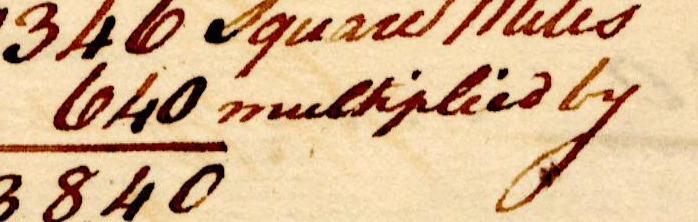640 multiplied by
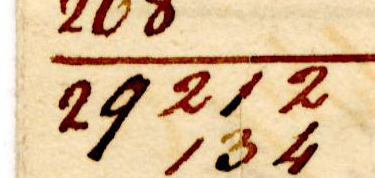29212
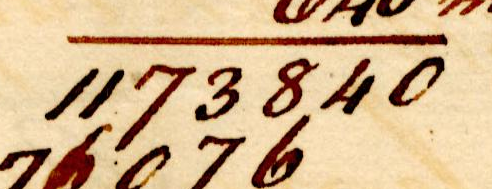1173840
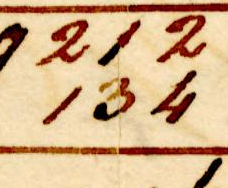134
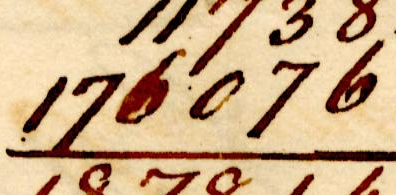176076
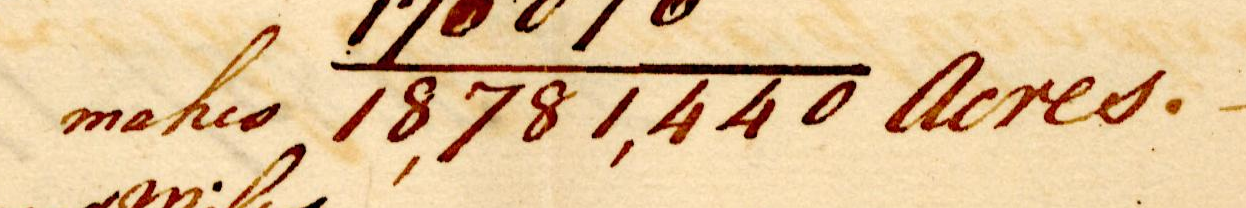makes 18,781,440 acres
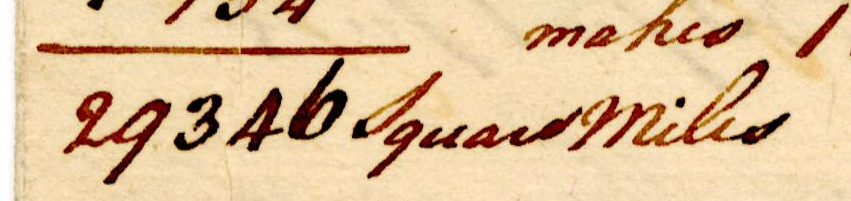29346 Square Miles
